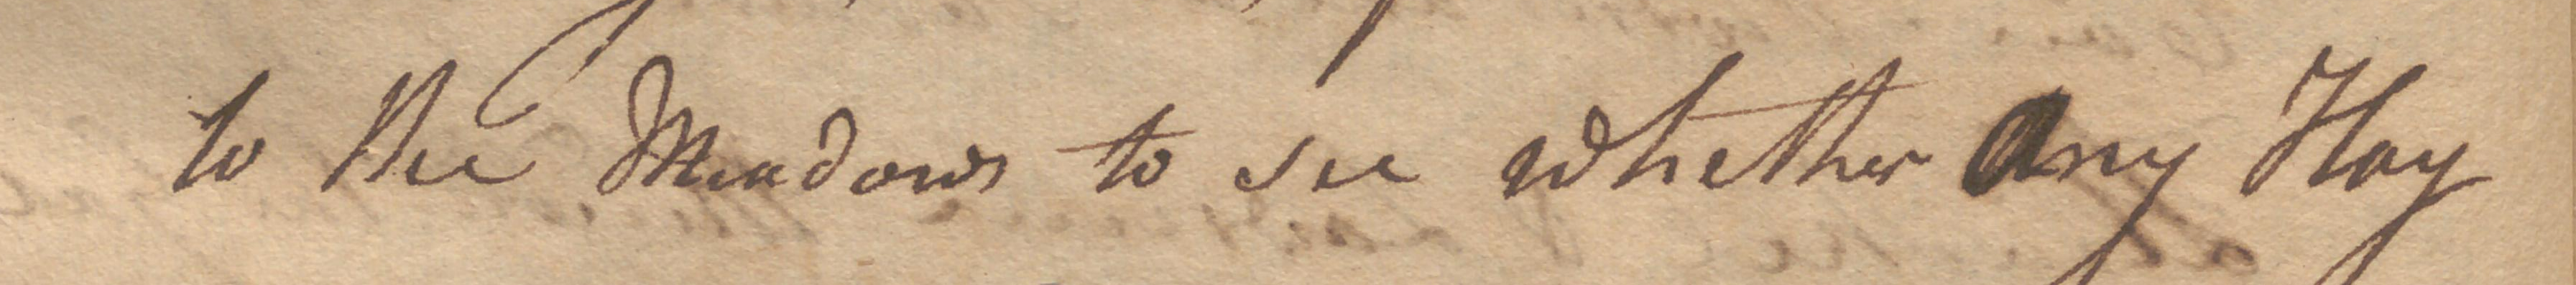to the Meadows to see whether any Hay
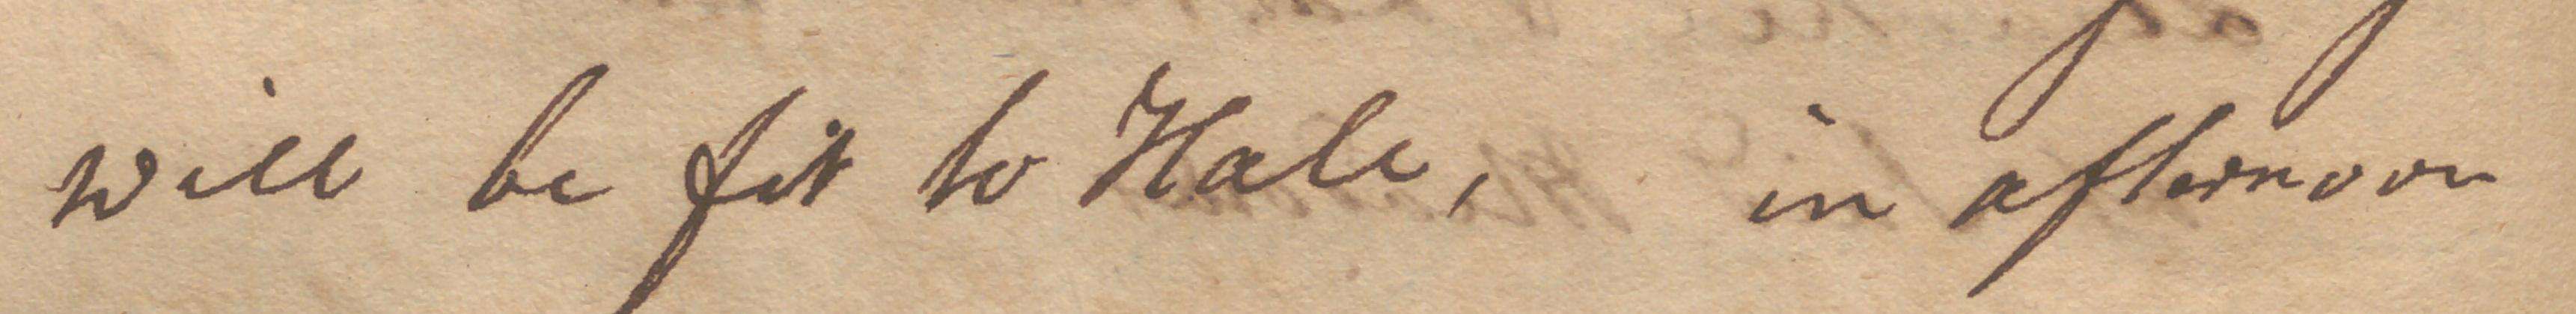will be fit to Hale, in afternoon
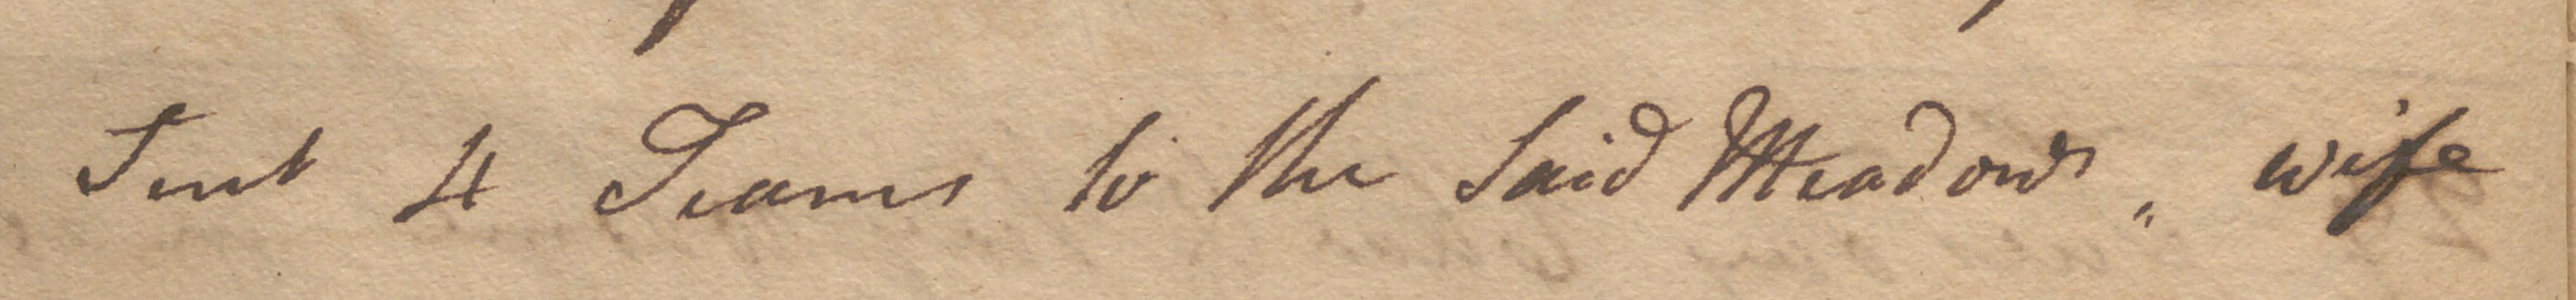sent 4 Teams to the Said Meadow, wife
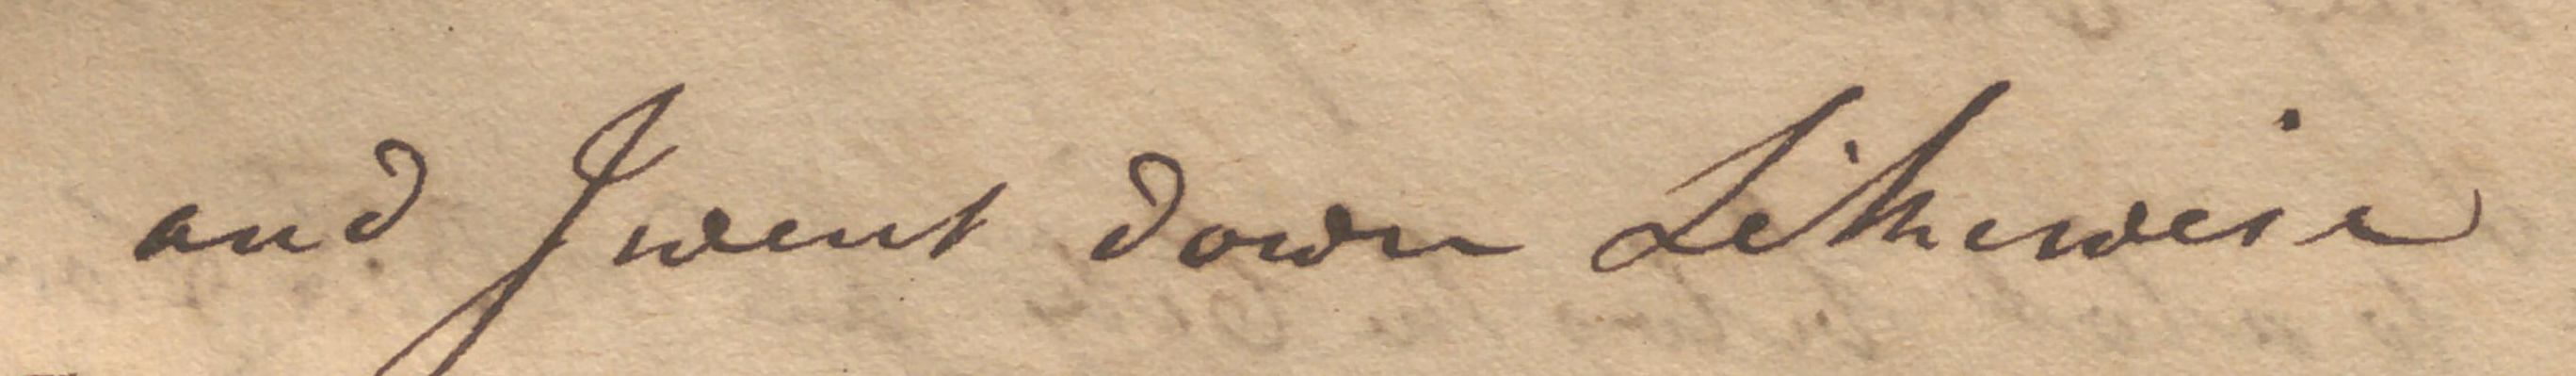and I went down Likewise
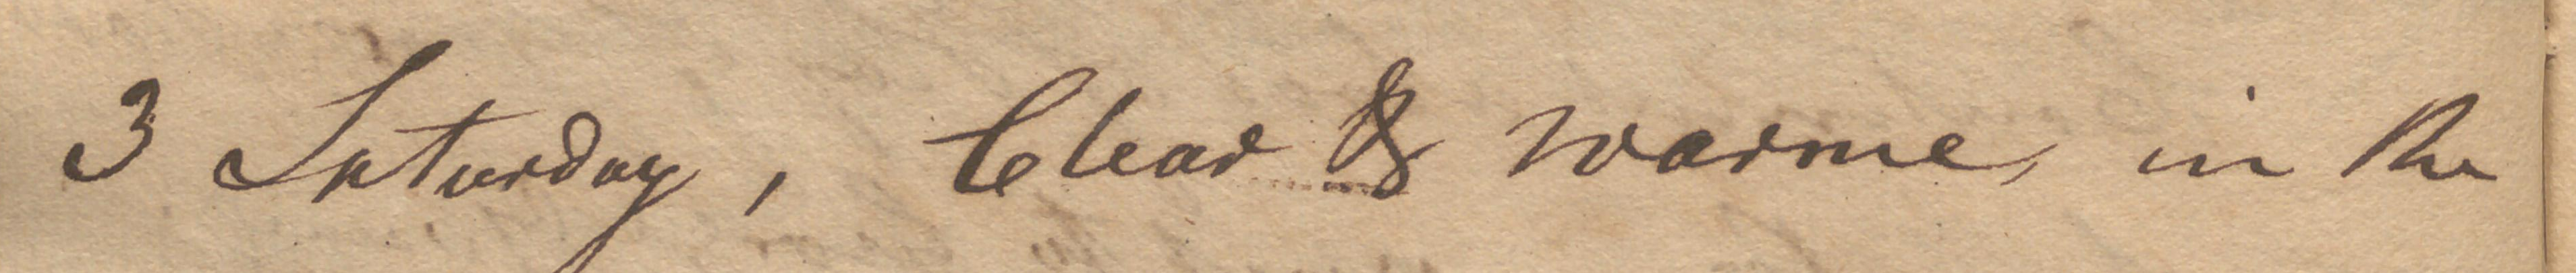3 Saturday, Clear & warme, in the
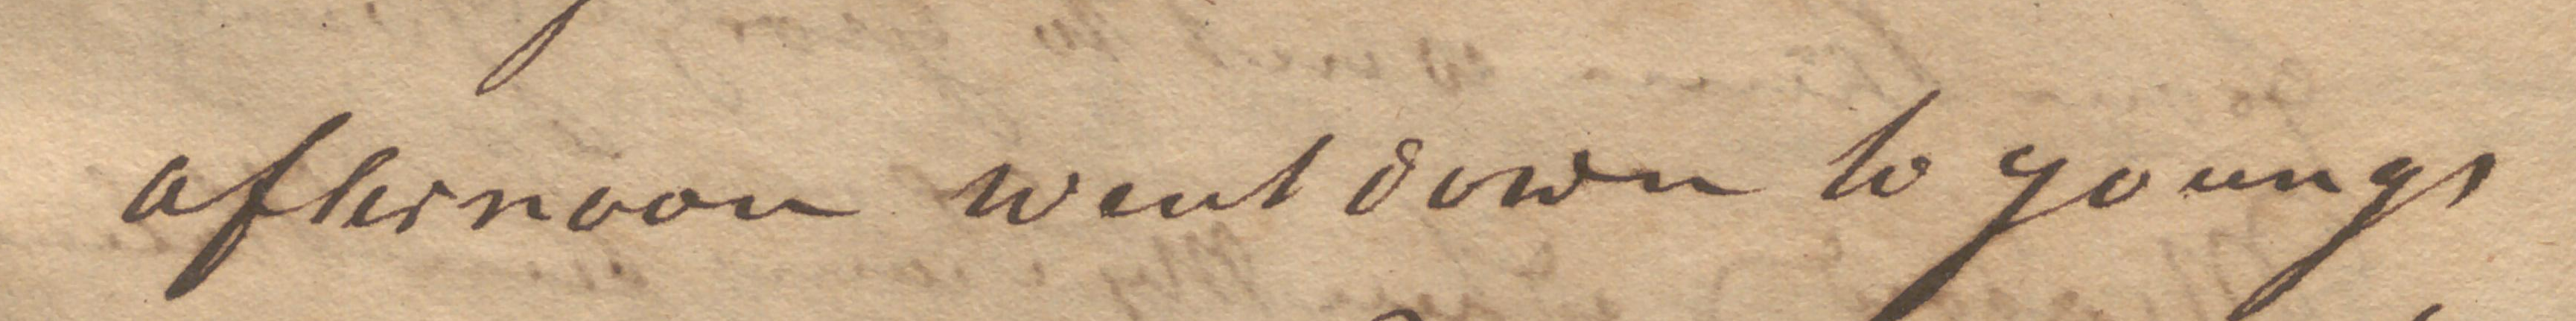afternoon went down to youngs
